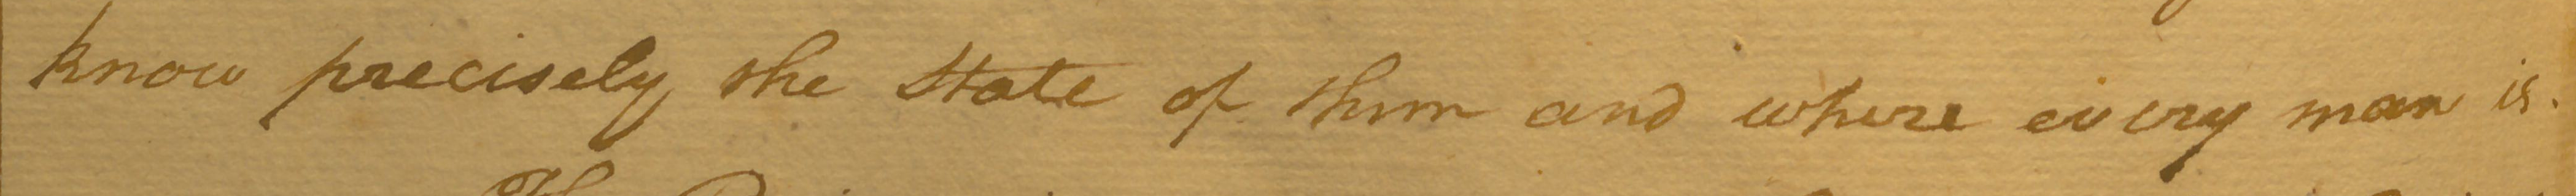know precisely the state of them and where every man is.
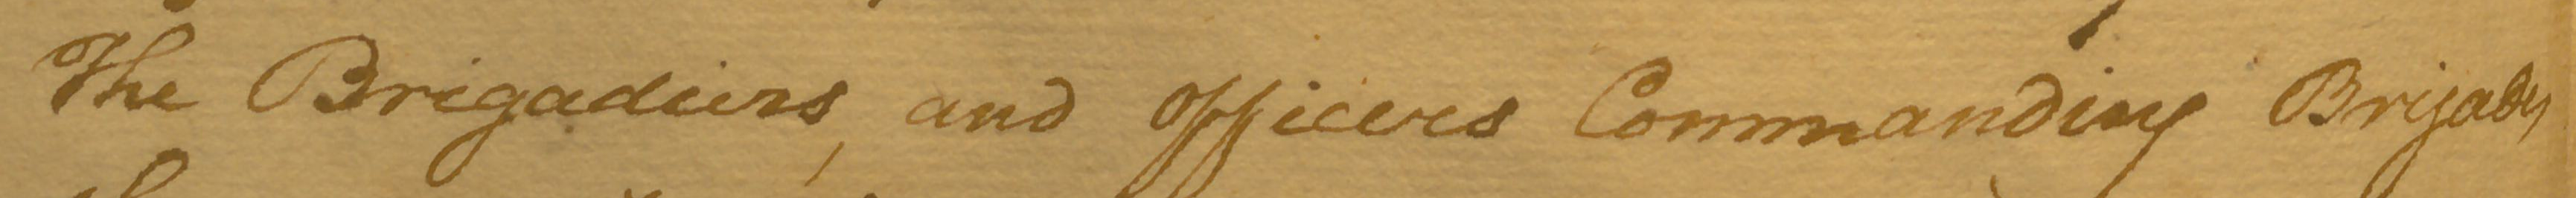The Brigadiers and officers Commanding Brigades
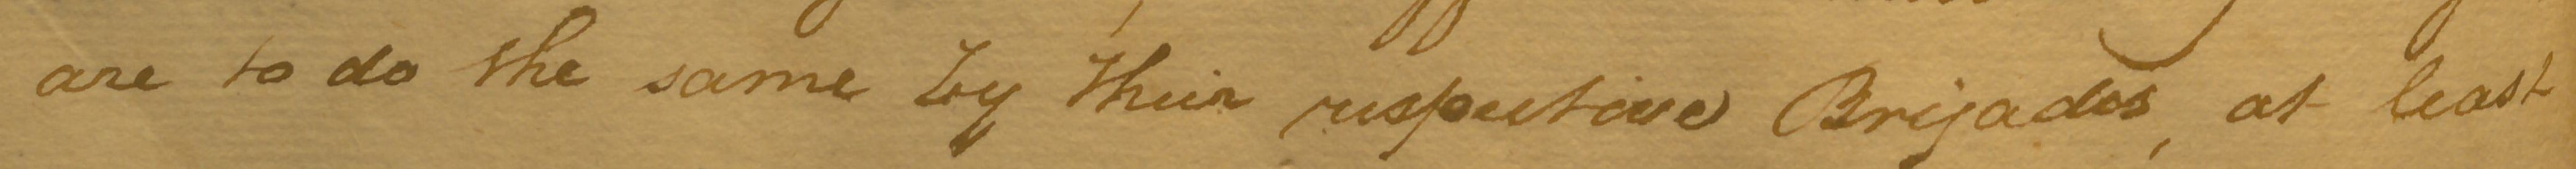are to do the same by their respective Brigades, at least
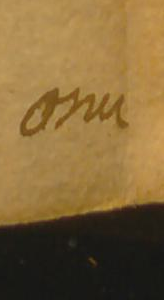once
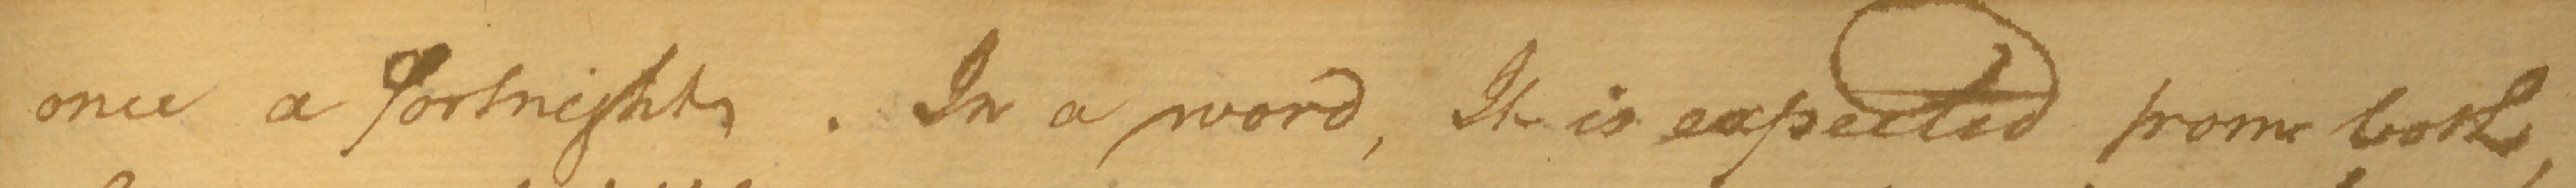once a fortnight. In a word, It is expected from both,
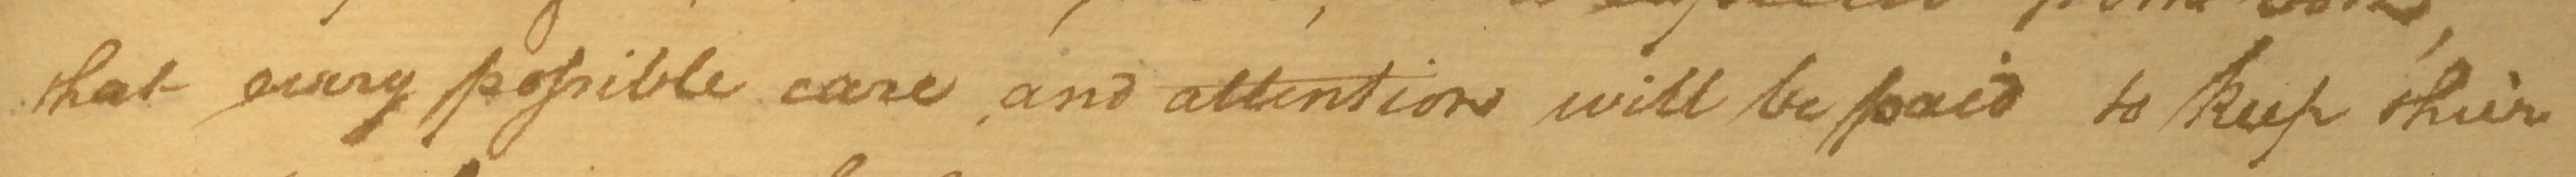that every possible care and attention will be paid to keep their
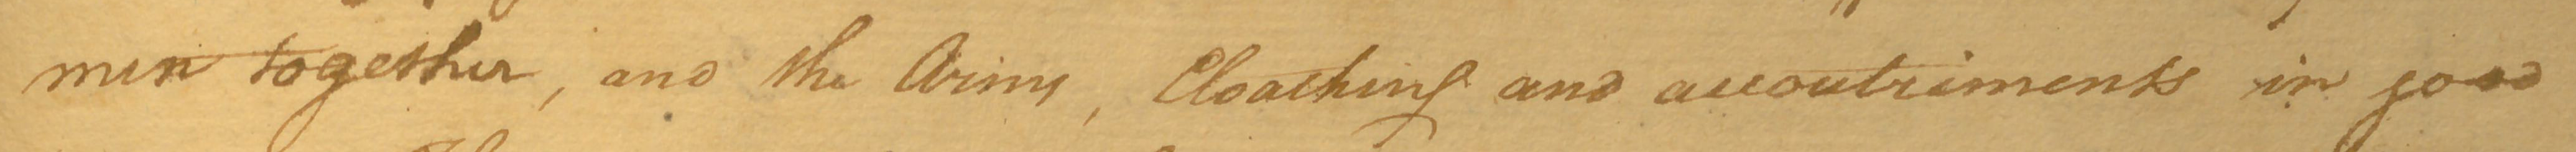men together, and the Arms, Cloathing and accoutriments in good
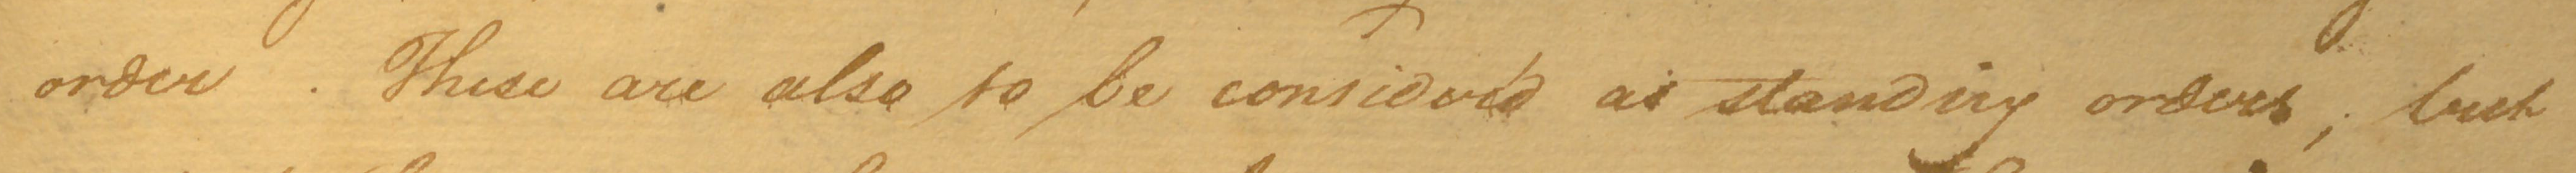order. These are also to be consider'd as standing orders, but
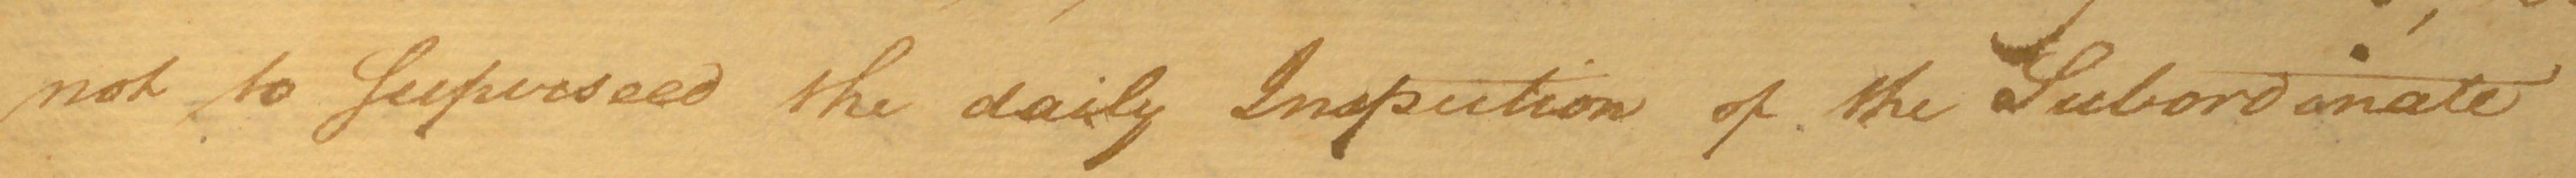not to superseed the daily Inspection of the subordinate
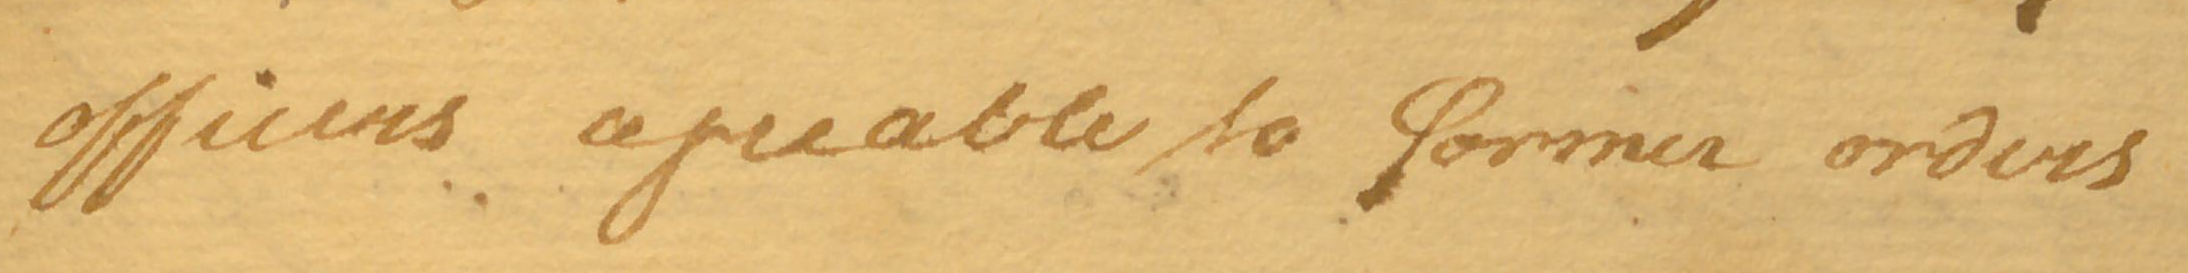officers agreable to former orders
